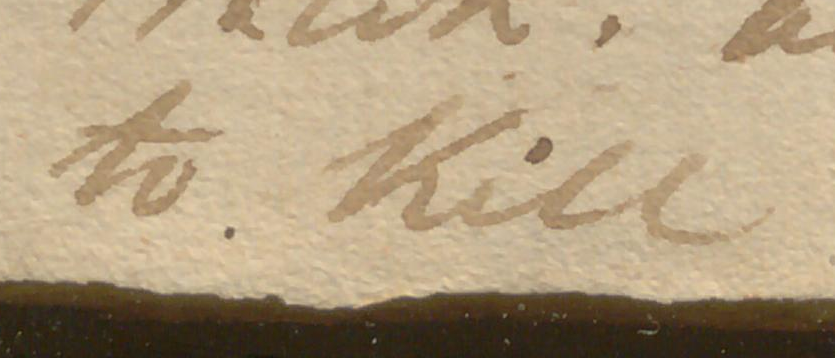to Kill
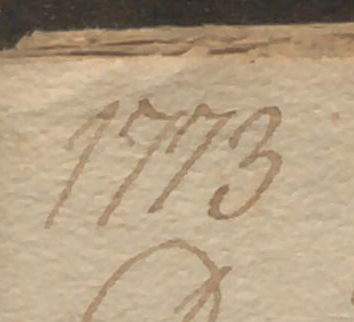1773
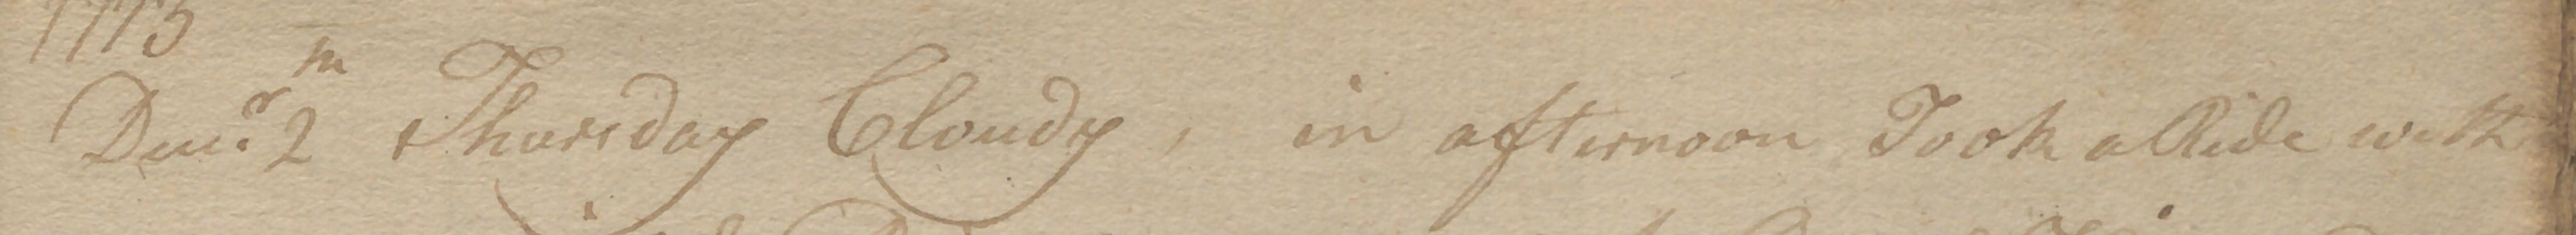Dec^r. 2^th Thursday Cloudy, in afternoon Took a Ride with
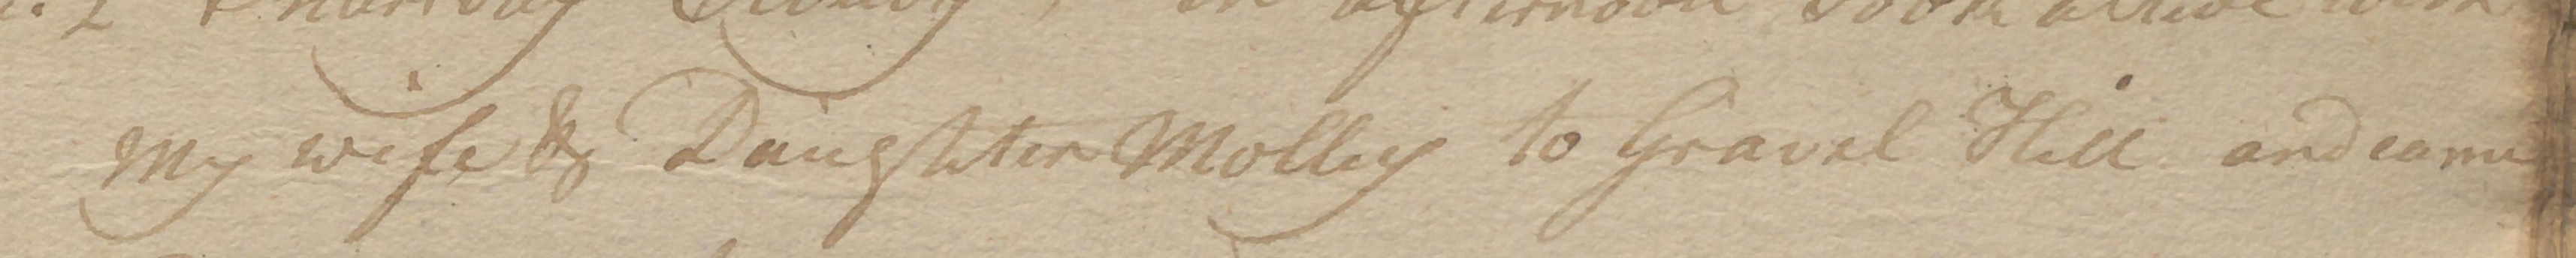my wife & Daughter Molley to Gravel Hill and came
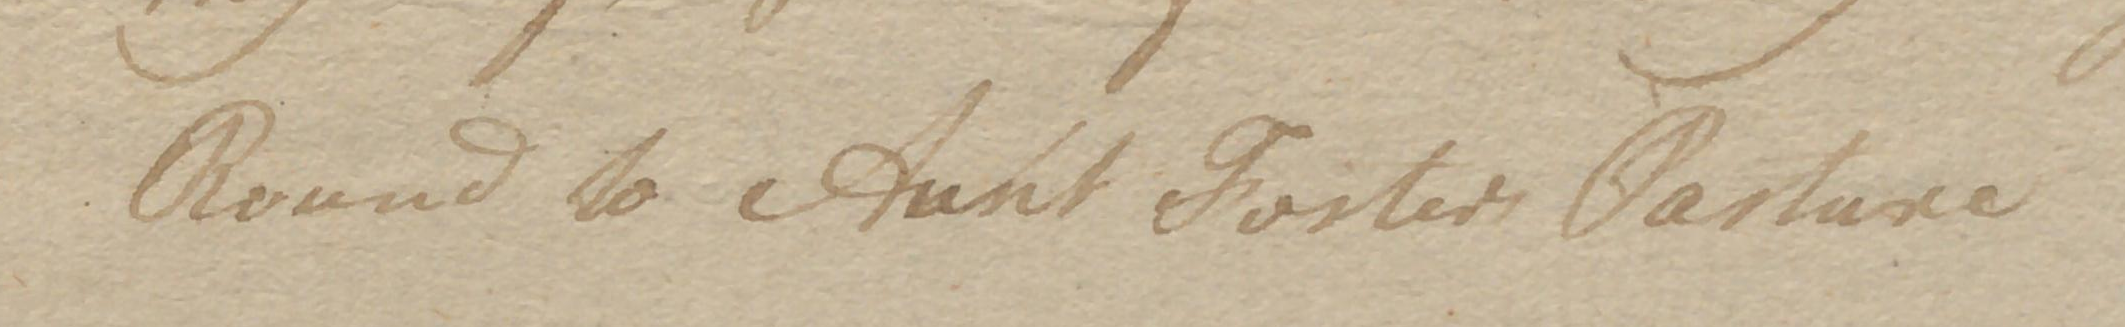Round to Aunt Fosters Pasture
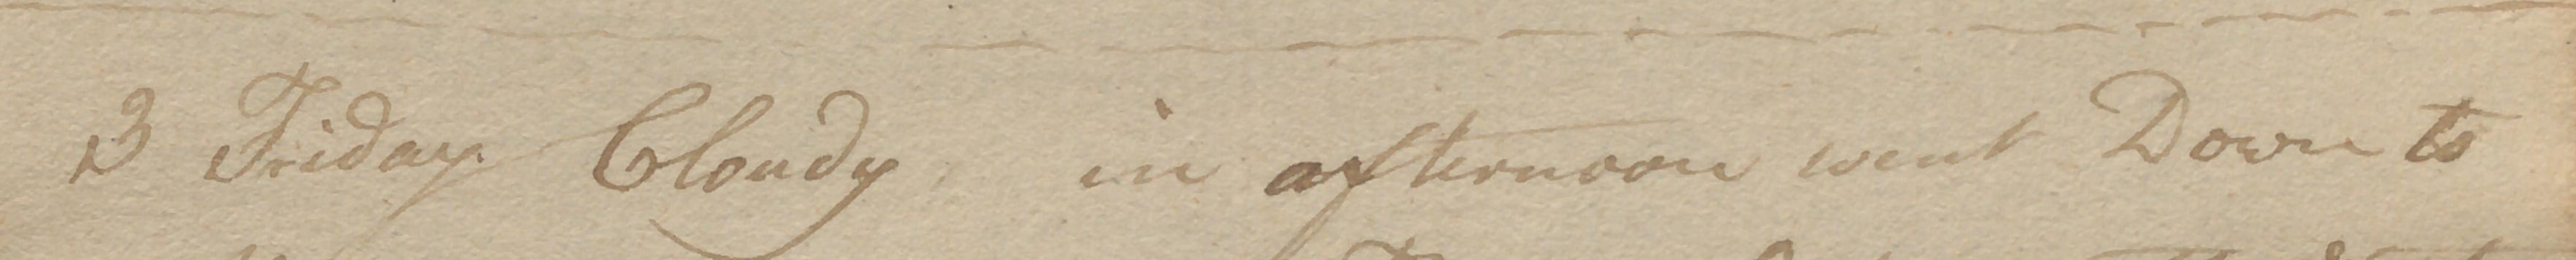3 Friday Cloudy, in afternoon went Down to
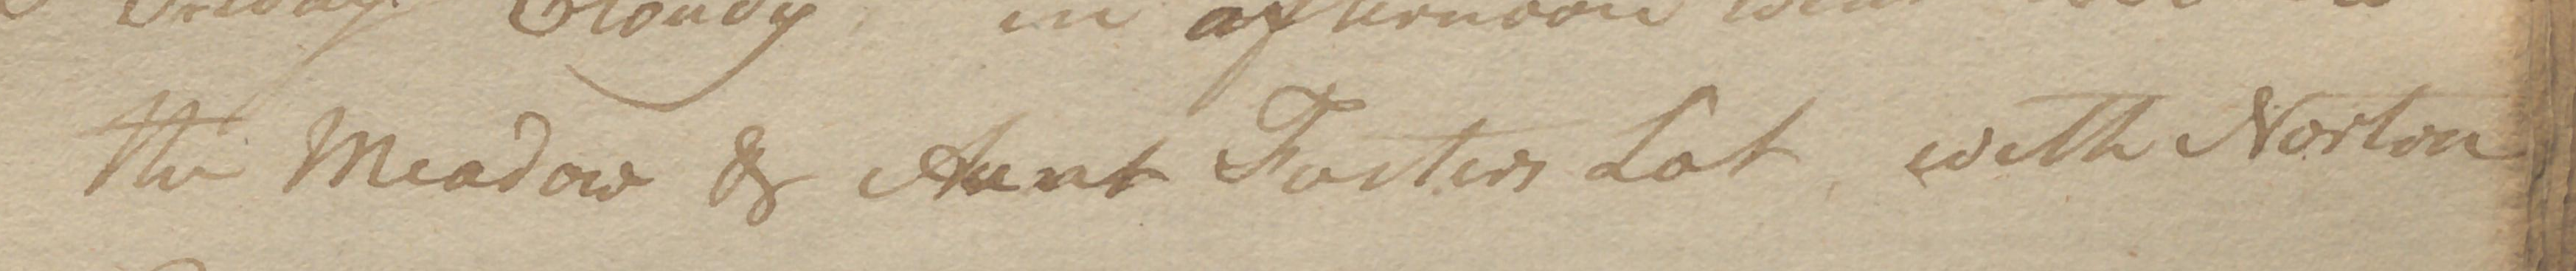the Meadow & Aunt Fosters Lot with Norton
